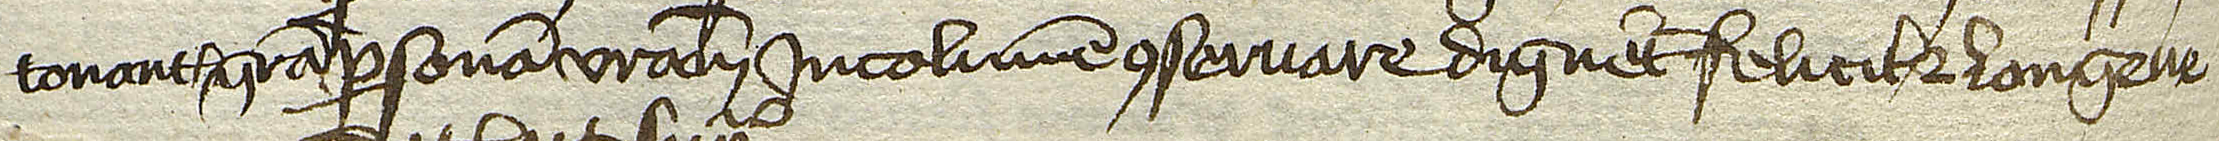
tonant* gr*a* p*ſona* v*ram Incolume* *ſeruare dignet* felicit* @ longeue
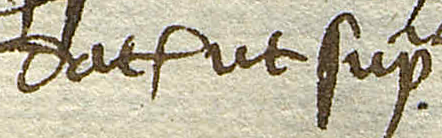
Dat* ut ſup*
